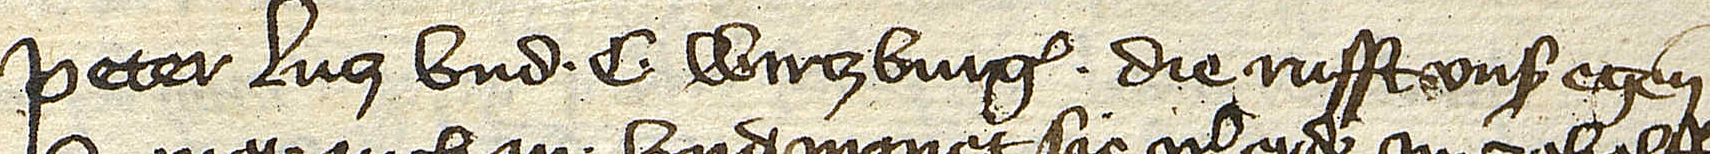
Peter lucʒ vnd . C . wircʒburg* . die rufft vnſ* egen*
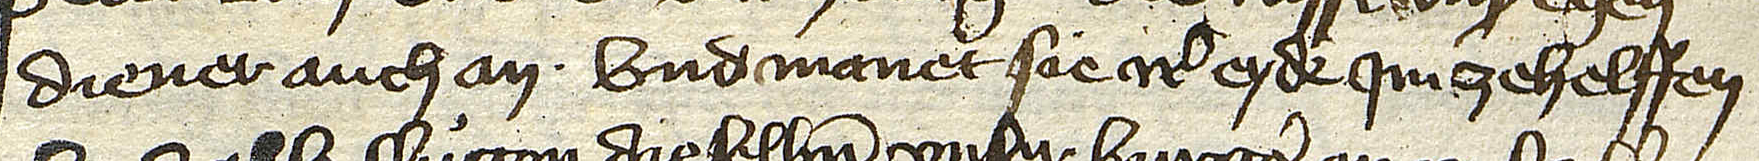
diener auch an . vnd manet ſie ir* eyde Im ʒehelffen
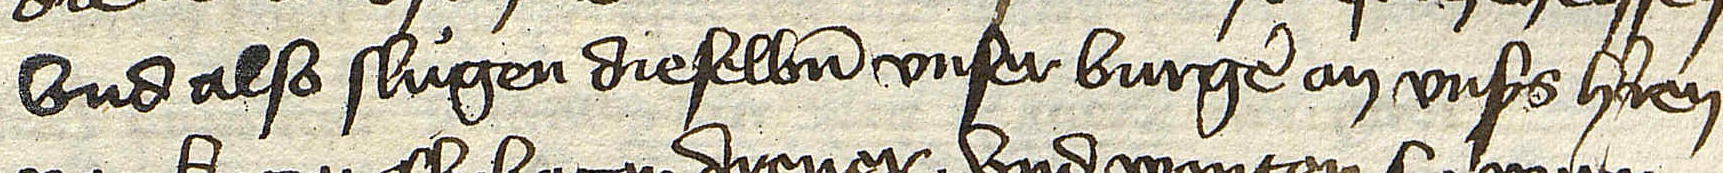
vnd alſo ſlügen dieſelb*n vnſer burge* an vnſ*s h*ren
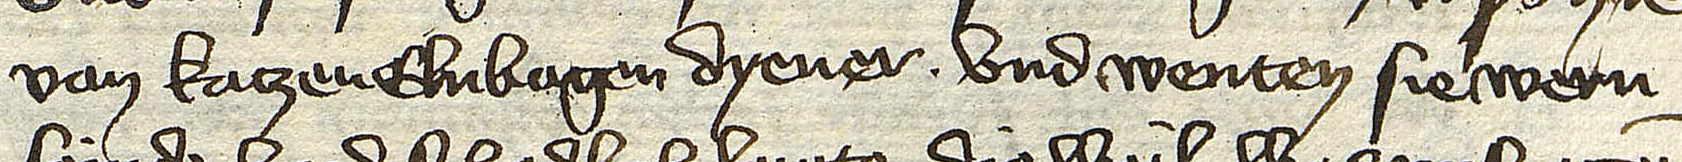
von kacʒen Elnbogen dyener . vnd wenten ſie wern
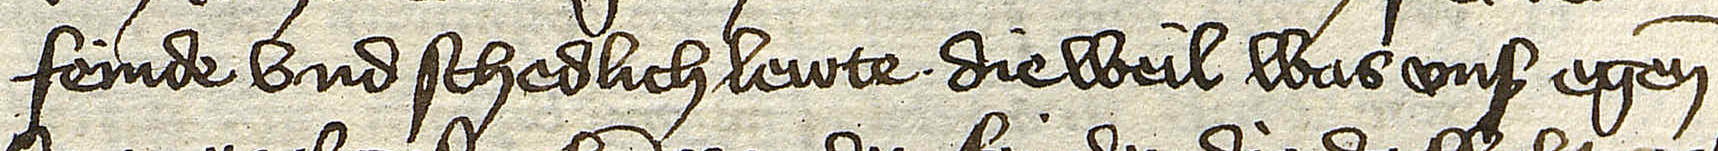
feinde vnd ſchedlich lewte . die weil was vnſ* egen*
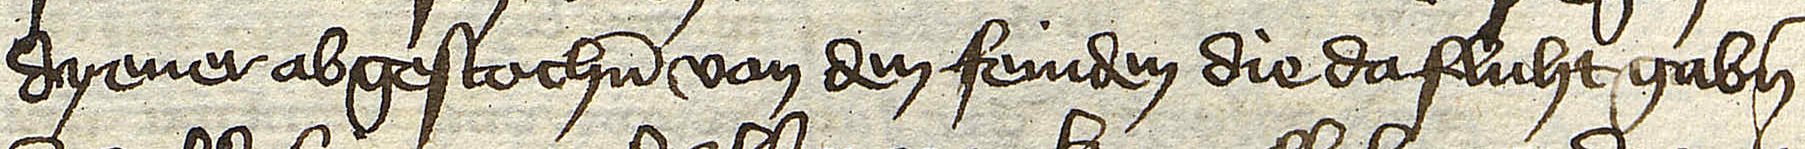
dyener abgeſtoch*n von den feinden die da fluht gab*n
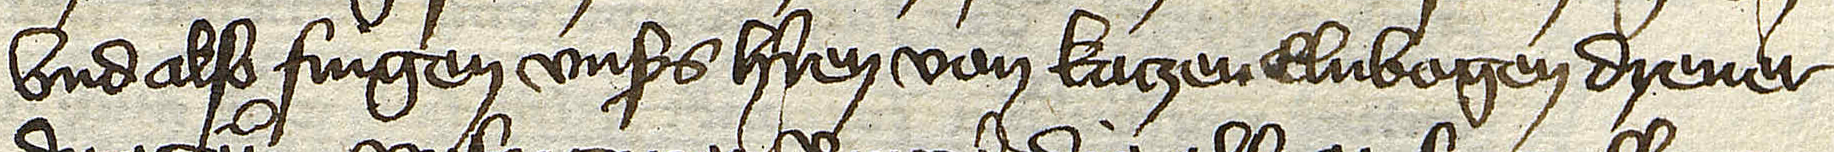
vnd alſo fingen vnſ*s h*ren von kacʒen Elnbogen dyener
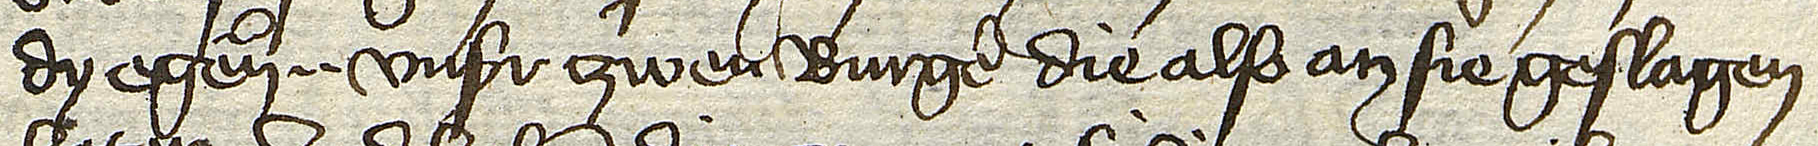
dy egen* ~ vnſ*r cʒwen Burge* die alſo an ſie geſlagen
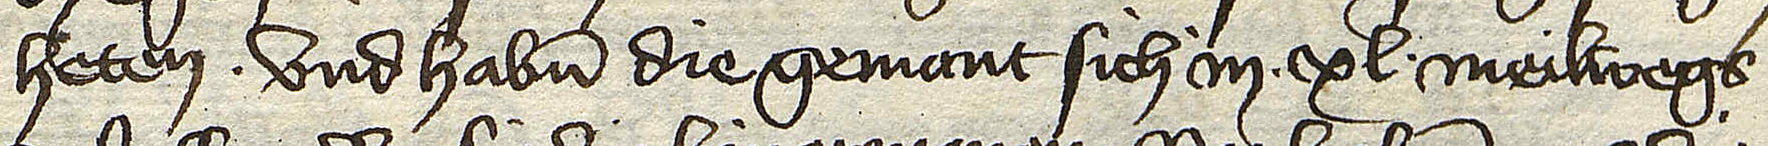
heten . Vnd hab*n die gemant ſich in . xl . meilwegs
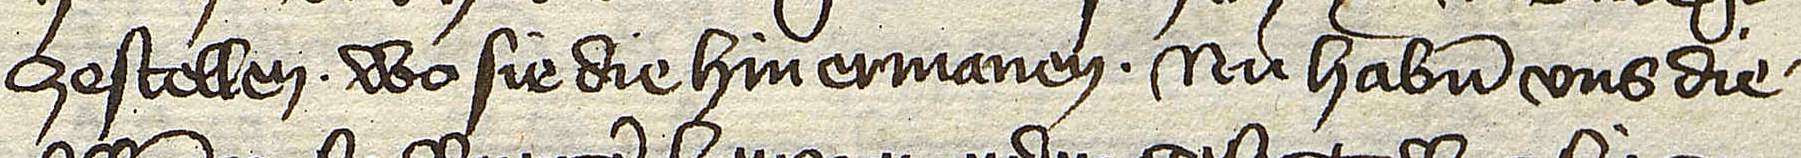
cʒeſtellen . wo ſie die hin ermanen . Nu hab*n vns die -
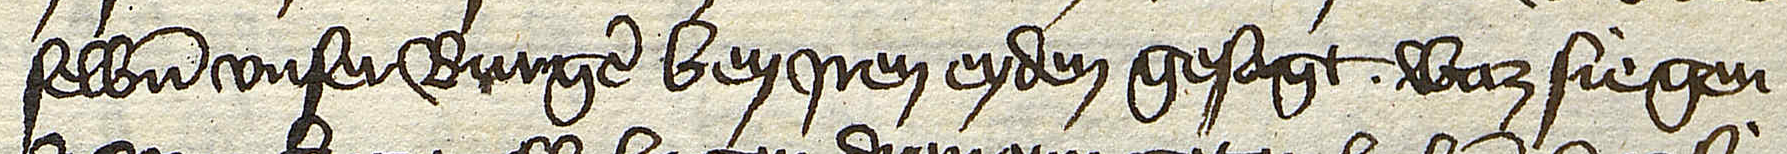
ſelb*n vnſer Burge* bey Iren eyden geſagt . waʒ ſie gen
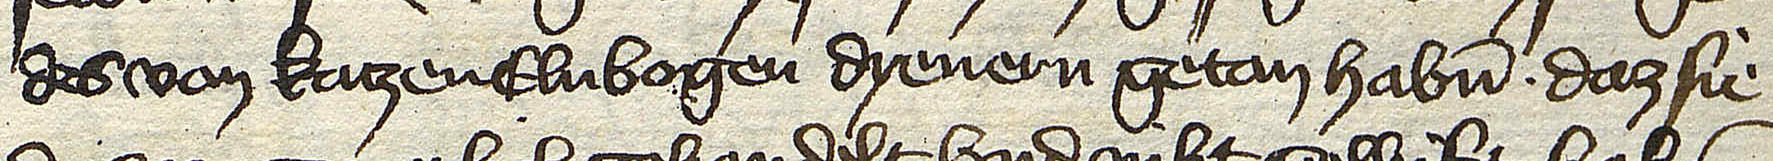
des von kacʒen Elnbogen dyenern getan hab*n . daʒ ſie
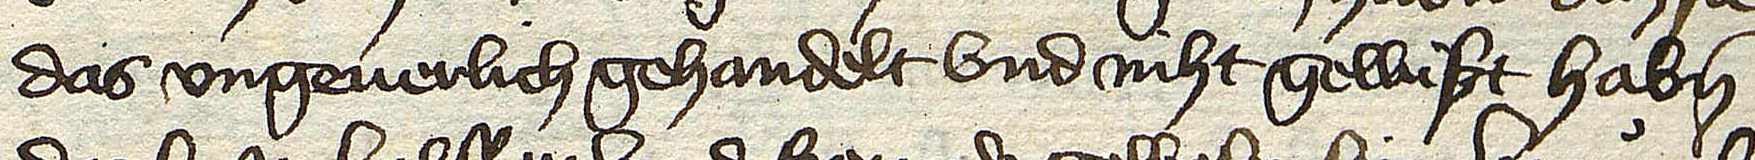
das vngeuerlich gehandelt vnd niht gewiſʒt hab*n
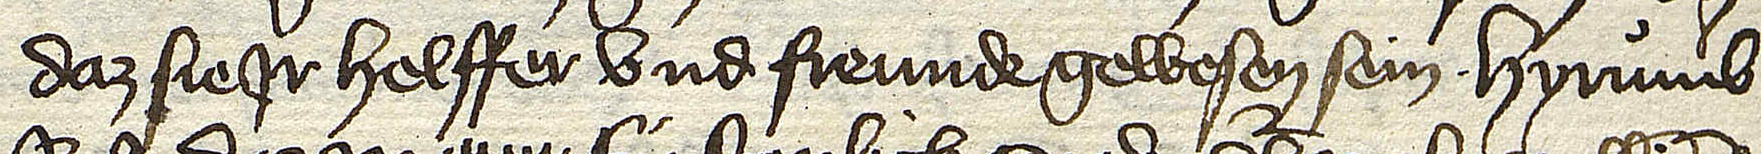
daʒ ſie Ir helffer vnd freunde geweſen ſein . Hyrümb
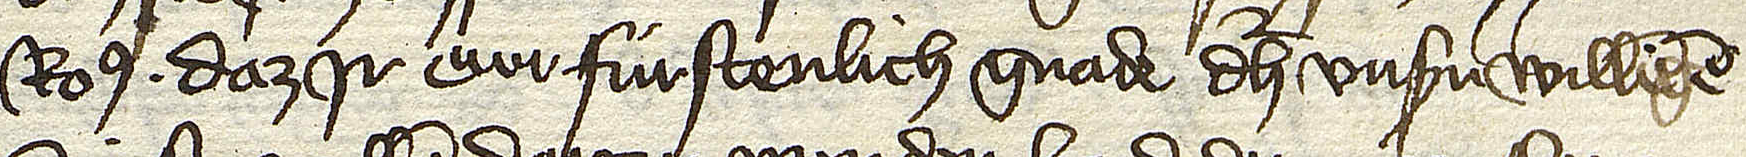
Ro* . daʒ Ir ewr fürſtenlich gnade d*h* vnſ*n willige*
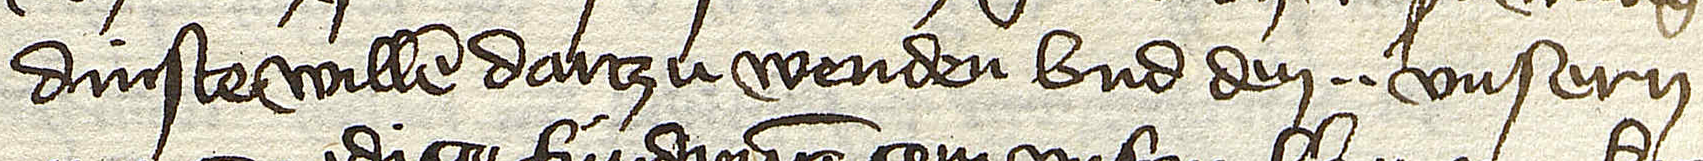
dinſte wille* darcʒu wenden vnd dem ~ vnſern
